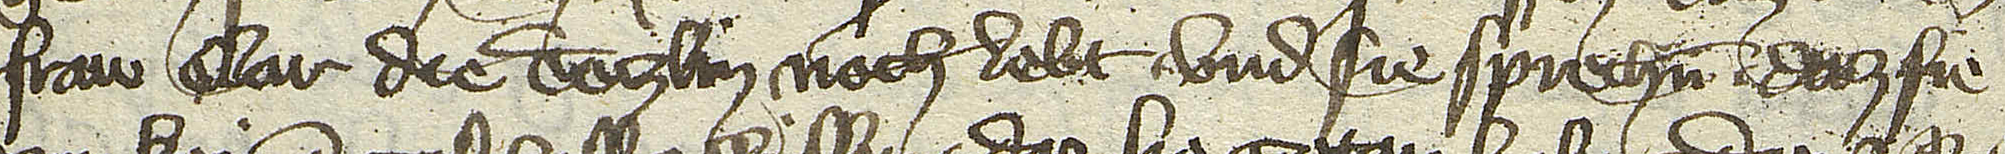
fraw Clar die Tecʒlin noch lebt / vnd ſie ſprechn* / daʒ ſie
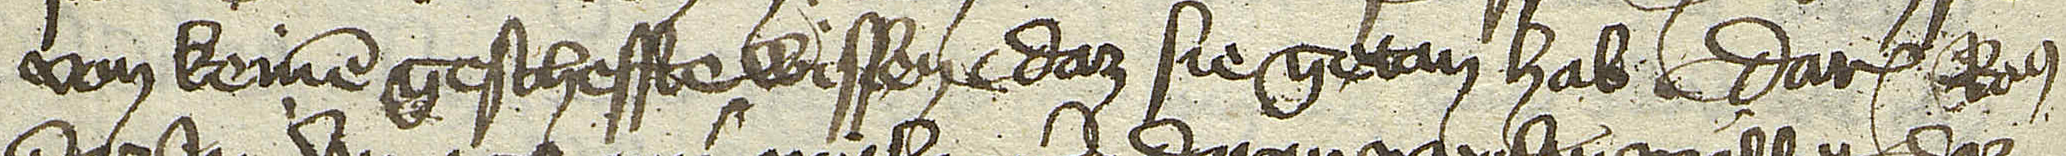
von keine* geſcheffte wiſſen / daʒ ſie getan hab / Dar* Ro*
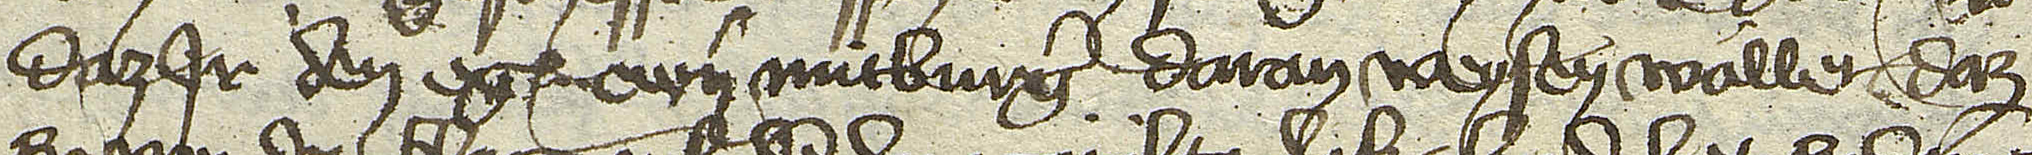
daʒ Ir den eg* ~ ewn* mitburg* daran weyſen wöllet / daʒ
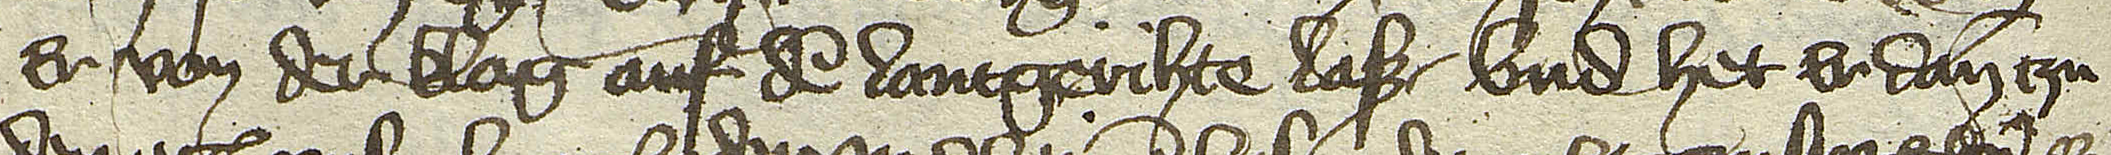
Er von der klag auf d* lantgerihte laſʒ / vnd het Er dan* cʒu
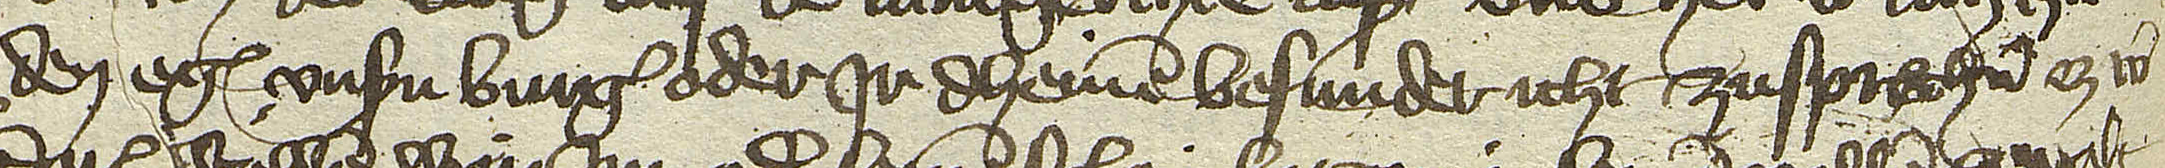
den eg* vnſ*n burg* oder Ir dheine* beſunder icht cʒuſprechn* eʒ w*
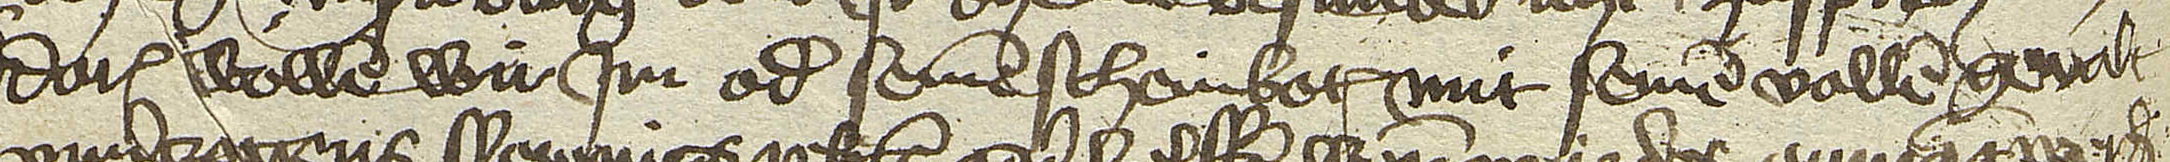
dar* wölle* wir Im od* ſeine* ſcheinbot* mit ſeine* volle* gewalt
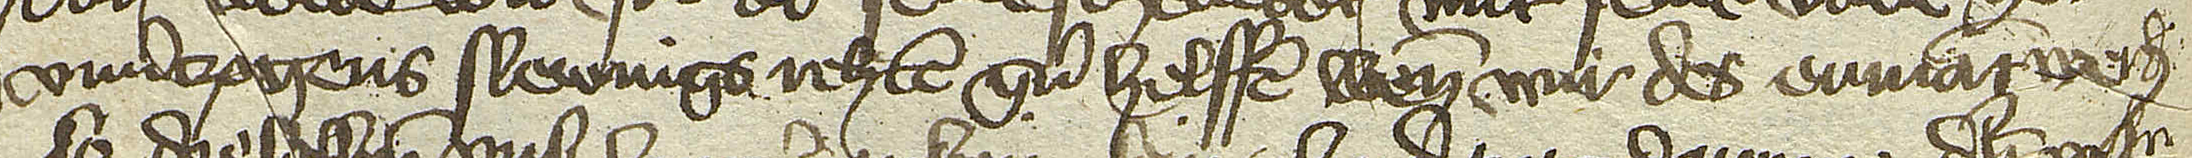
vnu*cʒogens ſlewnigs rehte* gn* helffe* wen* wir des ermat* werd*
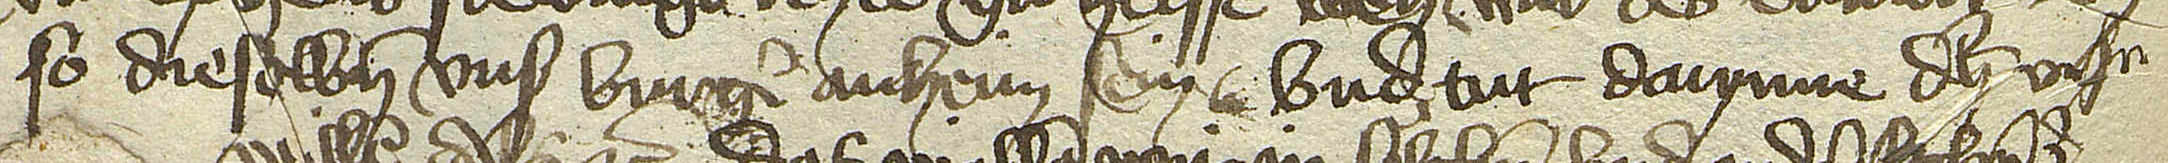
ſo dieſelbn* vnſ* burg* anheim ſein / vnd tut darynne d*h vnſ*n
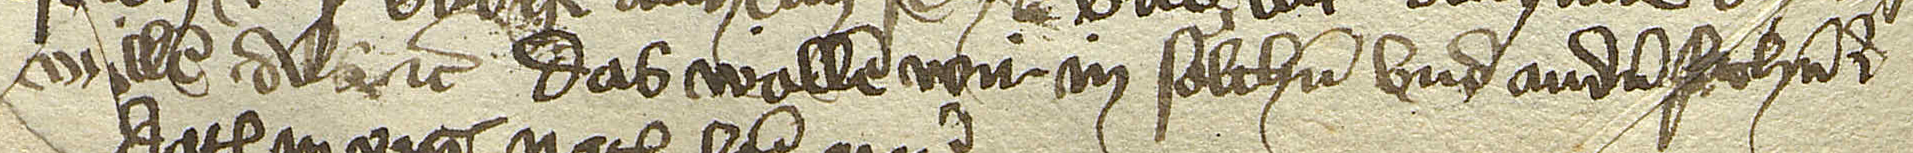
wille* / Als ec* das wölle* wir in ſolichn* vnd andn* ſachn* ec*
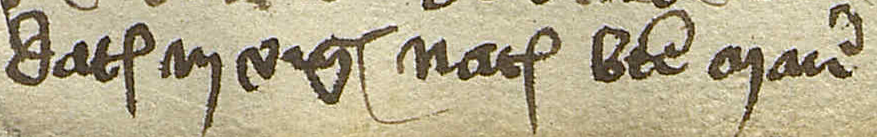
dat* in vig* nat* bte* Maie*
